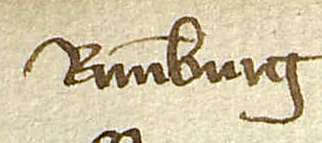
R%%burg
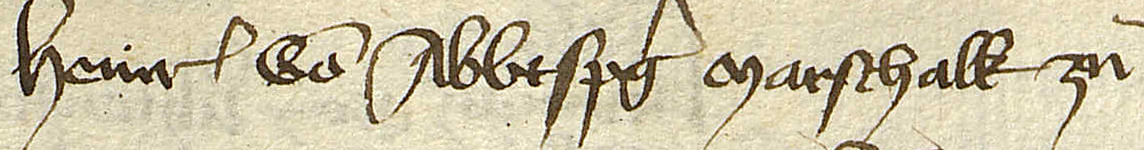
heinr* vo* Abbtſpg* Marſchalk cʒu
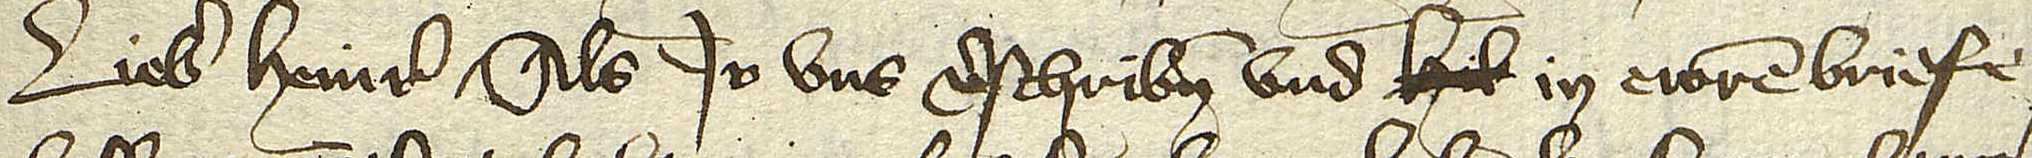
Lieb* heinr* / Als Ir vns v*ſchribn* vnd Hil in ewre* briefe
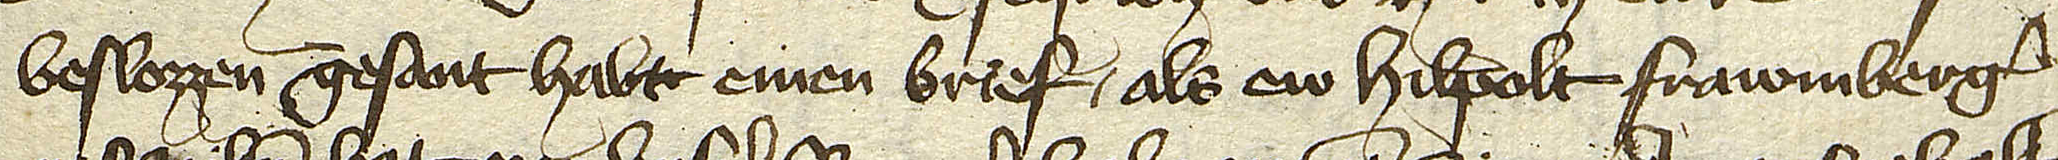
beſloʒʒen geſant habt einen brief / als ew Hilpolt frawmberg*
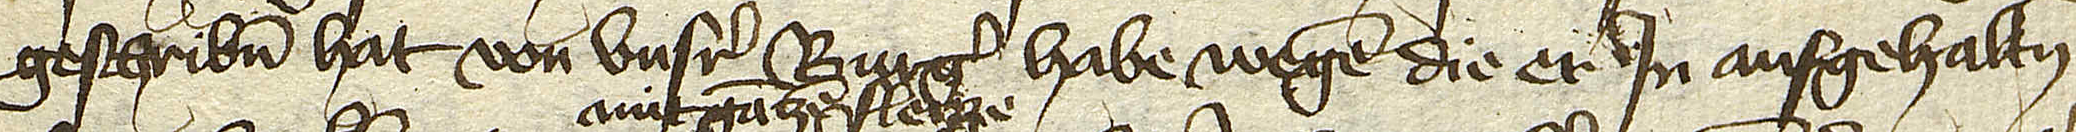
geſchribn* hat von vnſr* Burg* habe wege* die er In aufgehaltn*
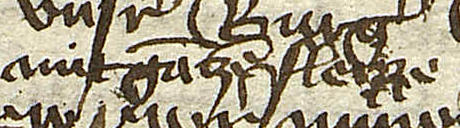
mit ga*cʒe* fleiʒʒe
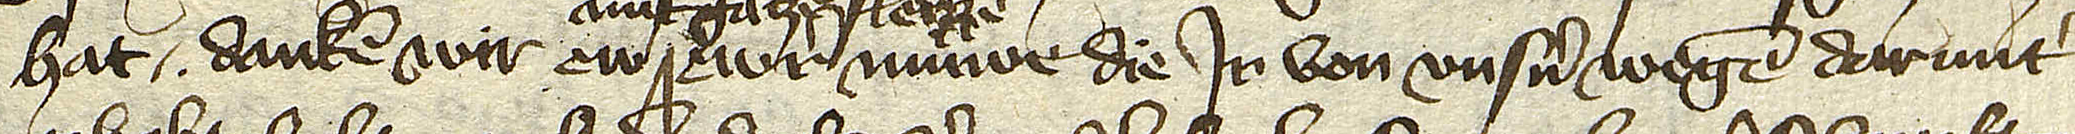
hat / . danke* wir ew ewr müwe die Ir von vnſn* wege* darunt*
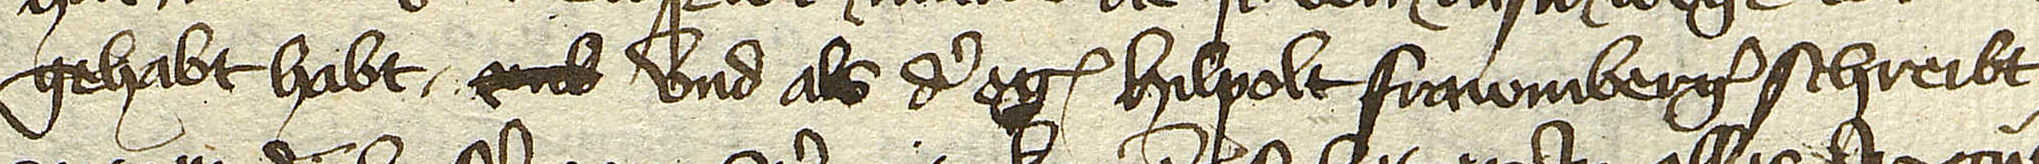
gehabt habt / vnb vnd als d* eg* hilpolt frawmberg* ſchreibt
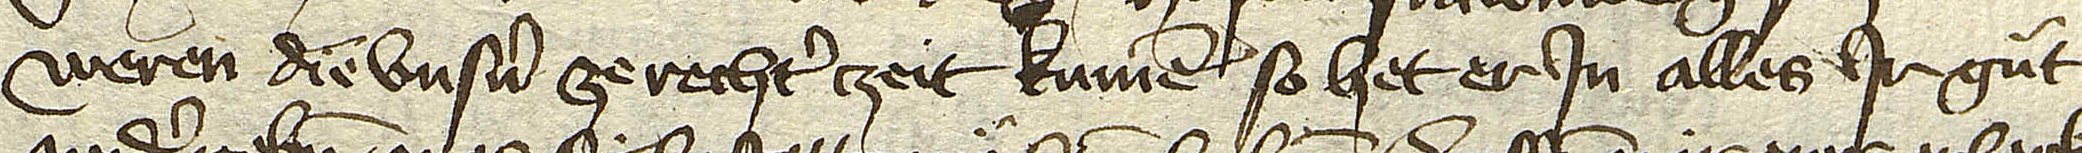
weren die vnſn* cʒe recht* cʒeit kume* ſo het er In alles Ir güt
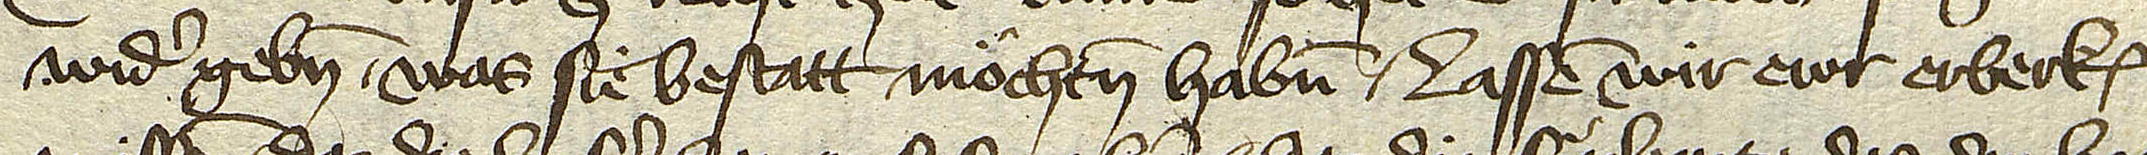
wid* gebn* / was ſie beſtatt möchtn* habn* / Laſſe* wir ewr erberk*
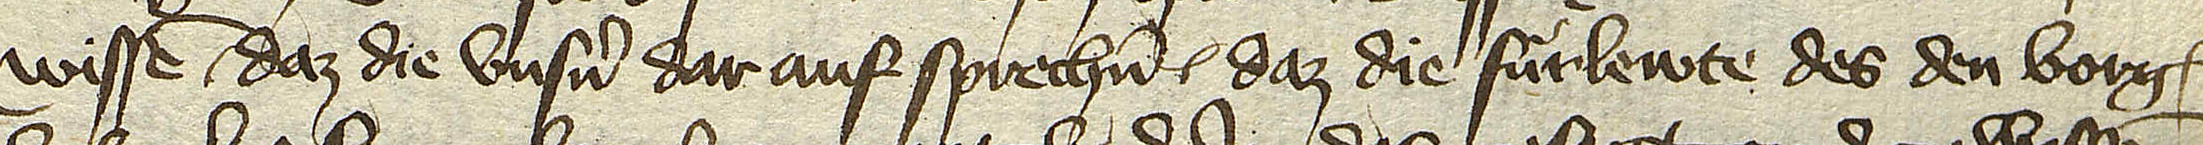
wiſſe* / daʒ die vnſn*dar auf ſprechn* / daʒ die fürlewte des den vorg*
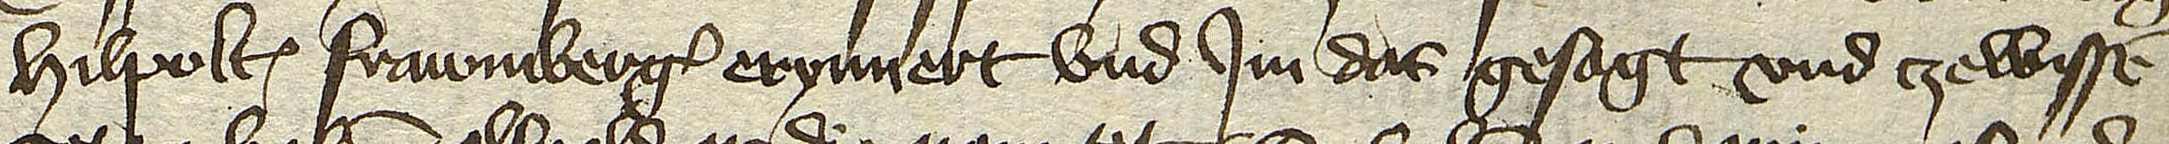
hilpolt* frawmberg* erynnert vnd Im das geſagt vns cʒewiſſe*
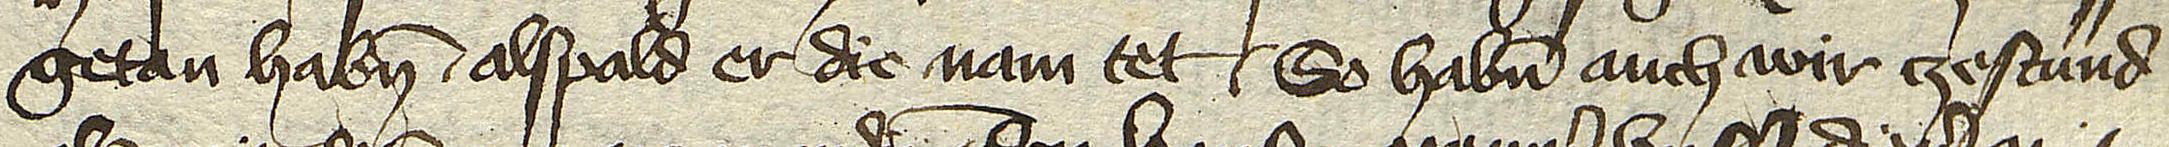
getan habn* / alſpald er die nam tet / So habn* auch wir cʒeſtund
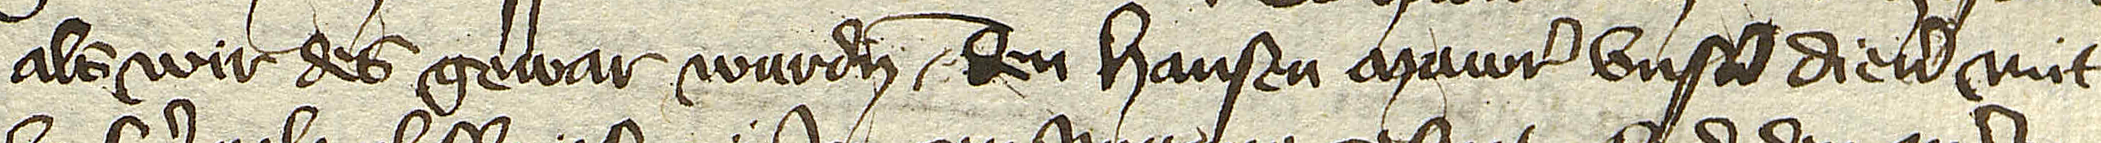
als wir des gewar wurdn* / den Hanſen Mawr* vnſn* dien* mit
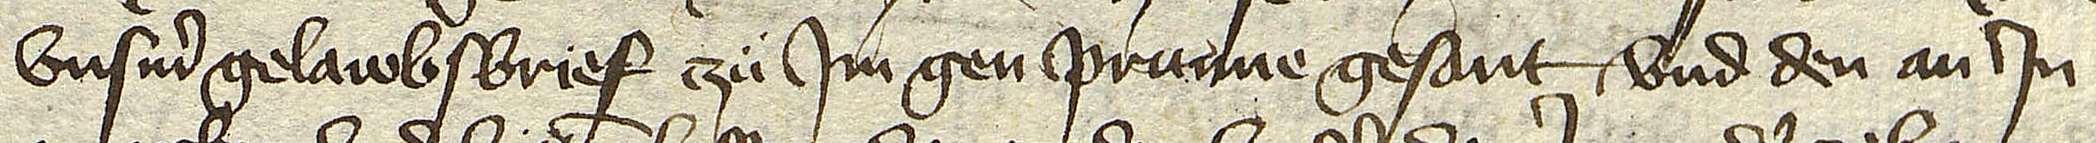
vnſm* gelawbſbrief cʒü Im gen Prunne geſant / vnd den an In
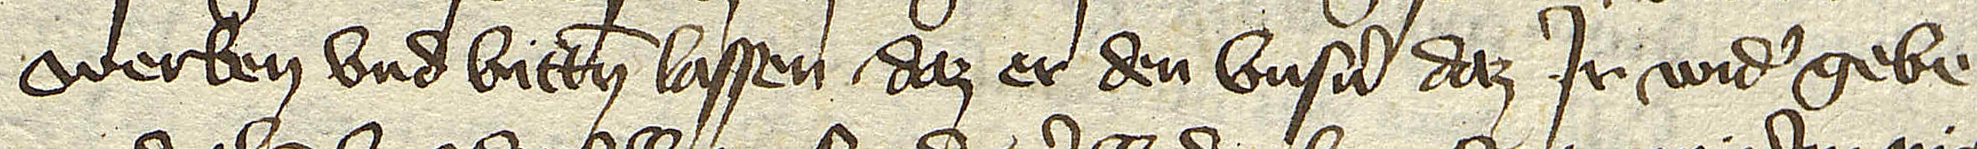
werben vnd bittn* laſſen / daʒ er den vnſn* daʒ Ir wid* gebe
